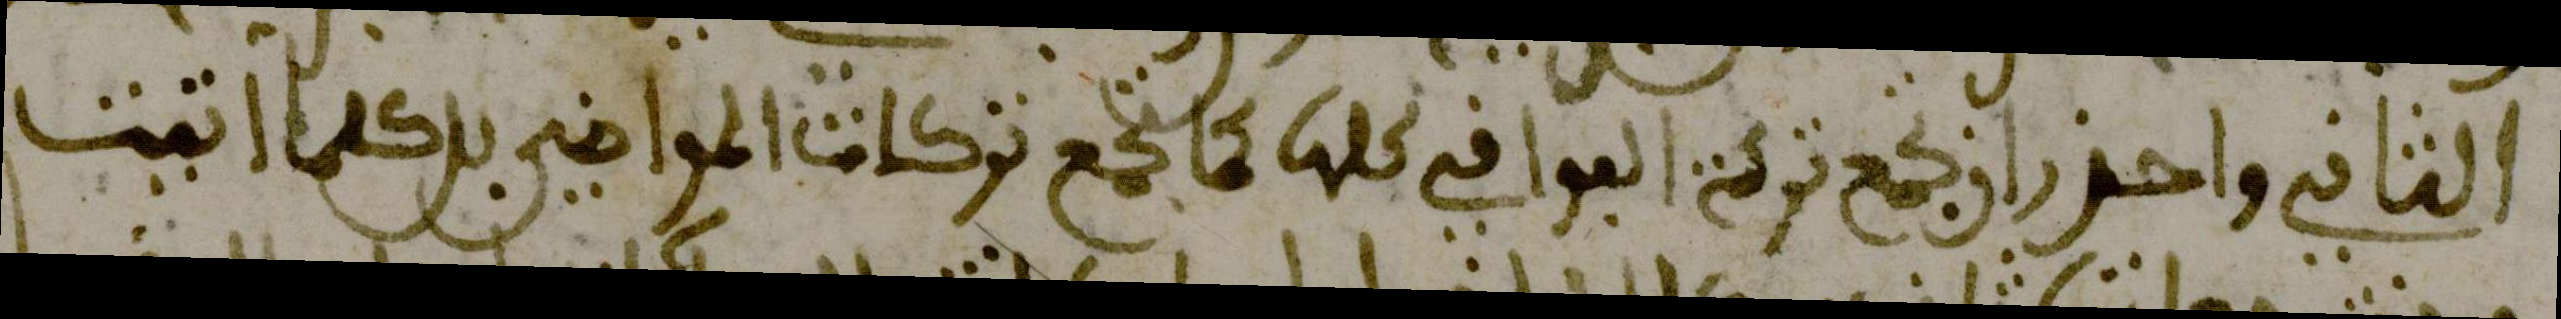الثاني واحذر ان تجمع تركة البواقي كلها كما تجمع تركات المواضي بل كلما اتيت
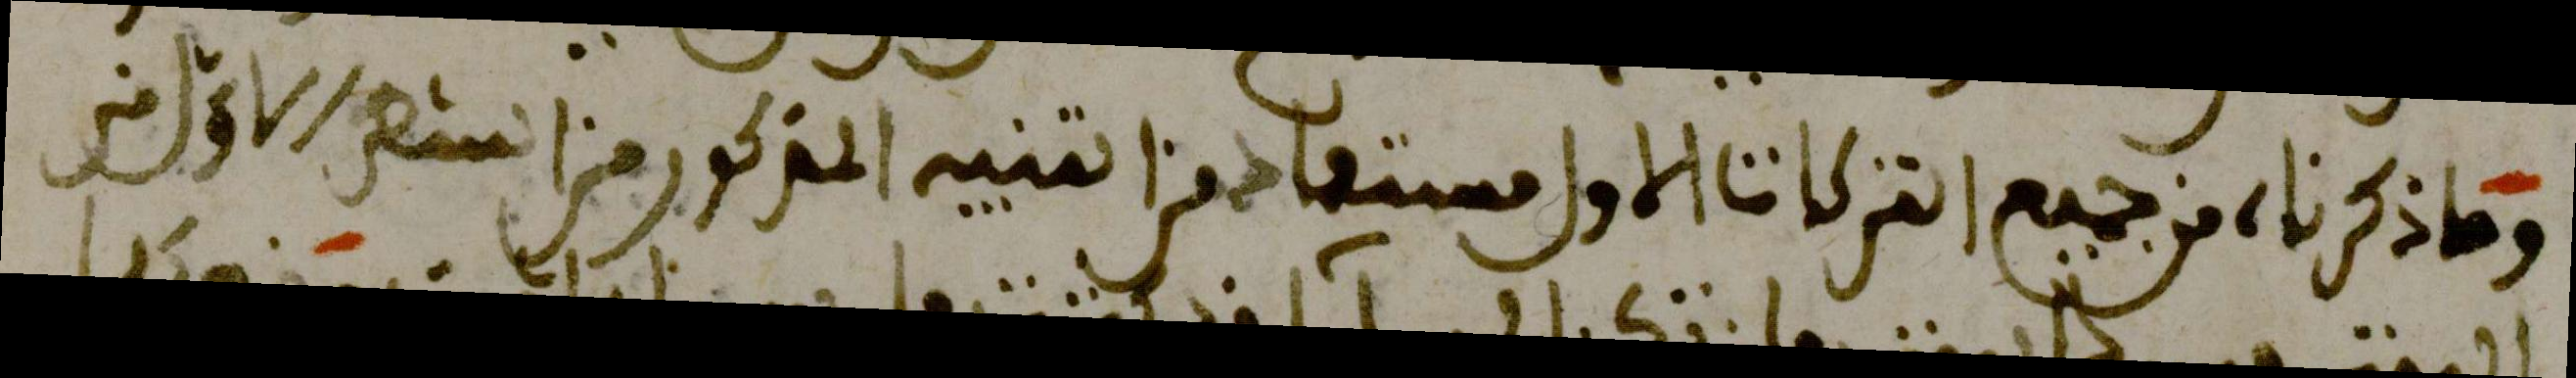وَما ذكرناه من جميع التركات الاول مستفاد من التنبيه المذكور من الشطر الاوّل من
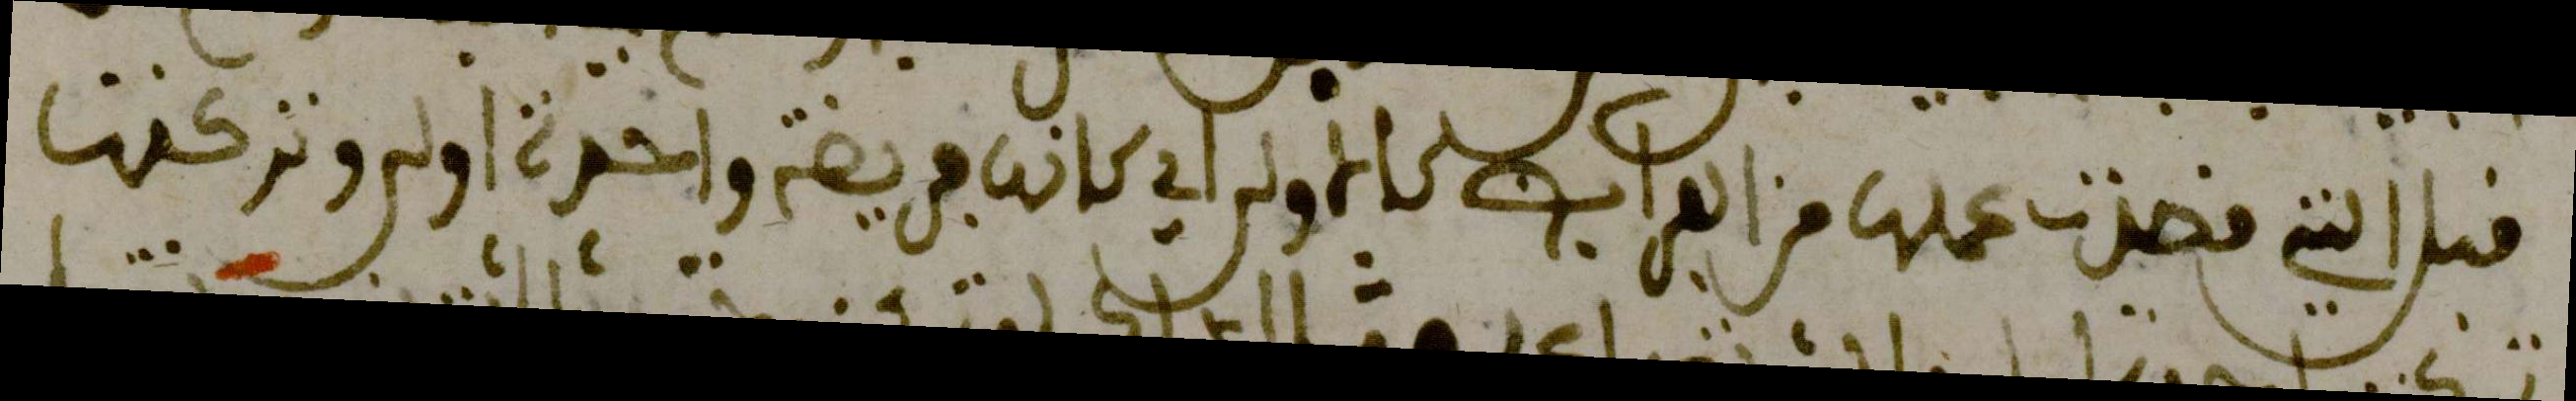قبل التي قصدت عملها من الفرائض كالاولى اي كانها فريضة واحدة اولى وتركتها
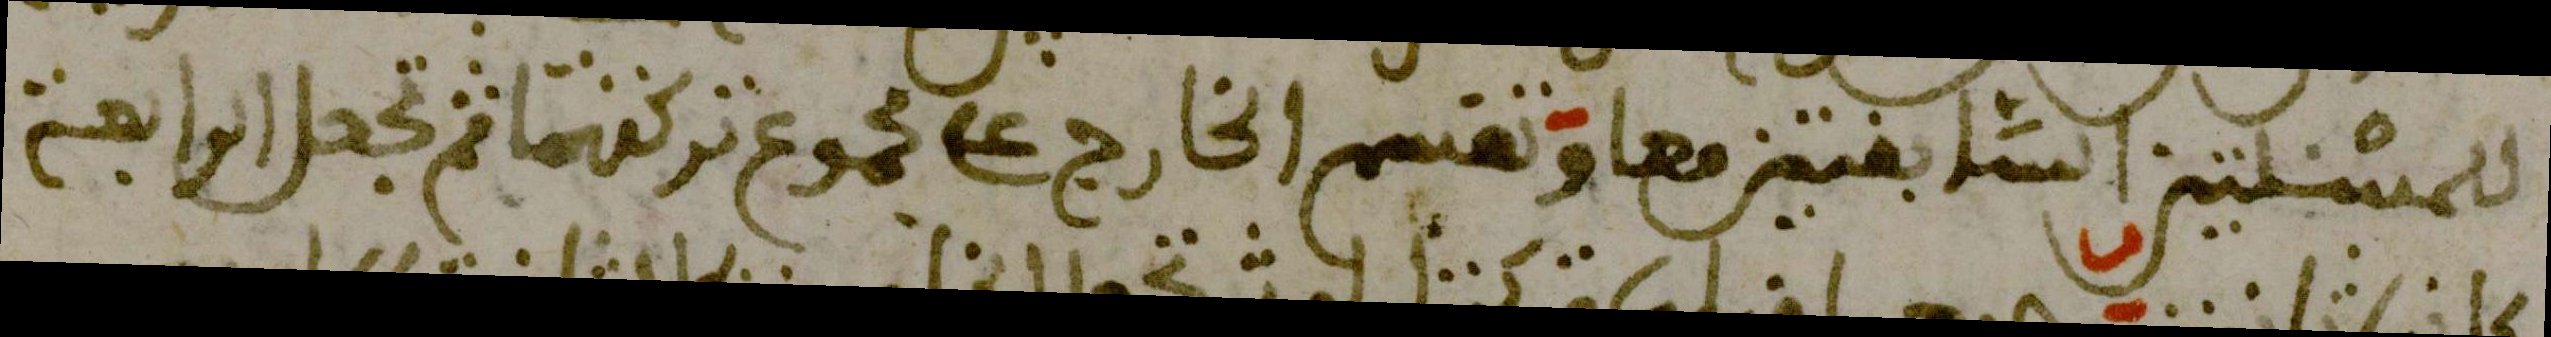للمسْئلتين السّايقتين معا وَتقسم الخارج على مجموع تركتهما ثم تجعل الرابعة
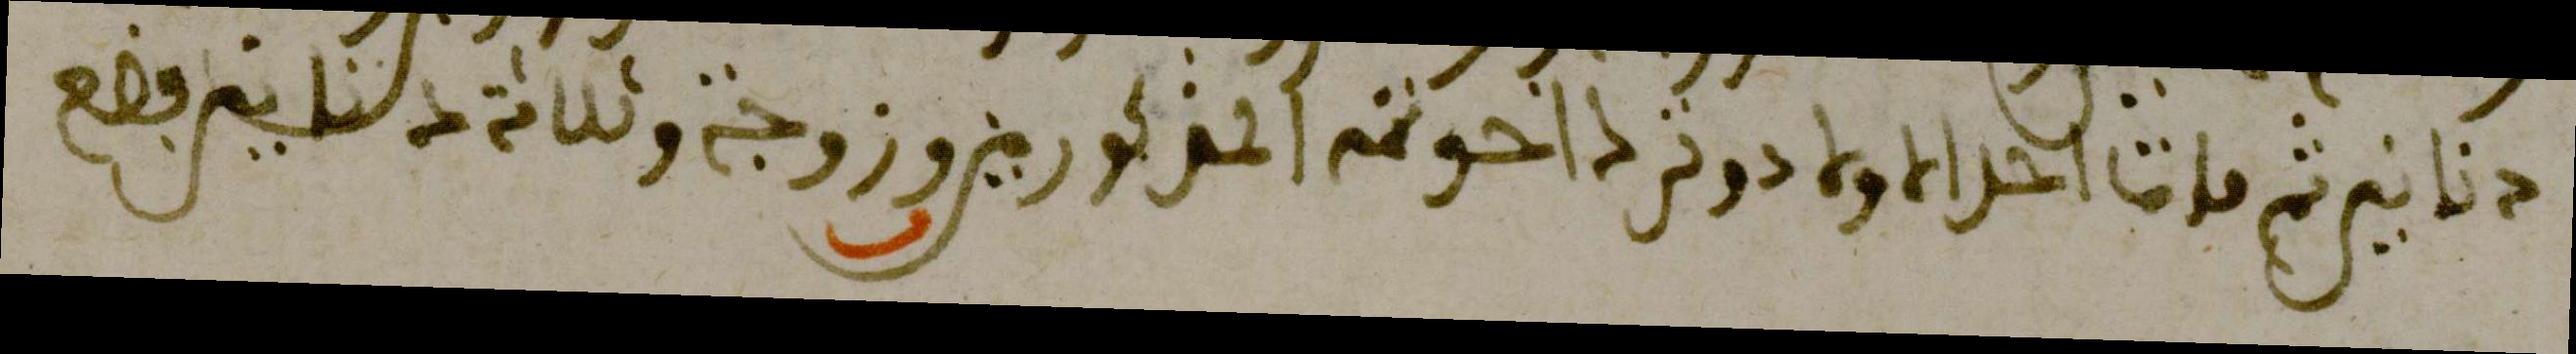دنانير ثم مات احدا لا ولاد وترك اخوته المذكورين وزوجة وزوجة ثلاثة دنانير فضع
